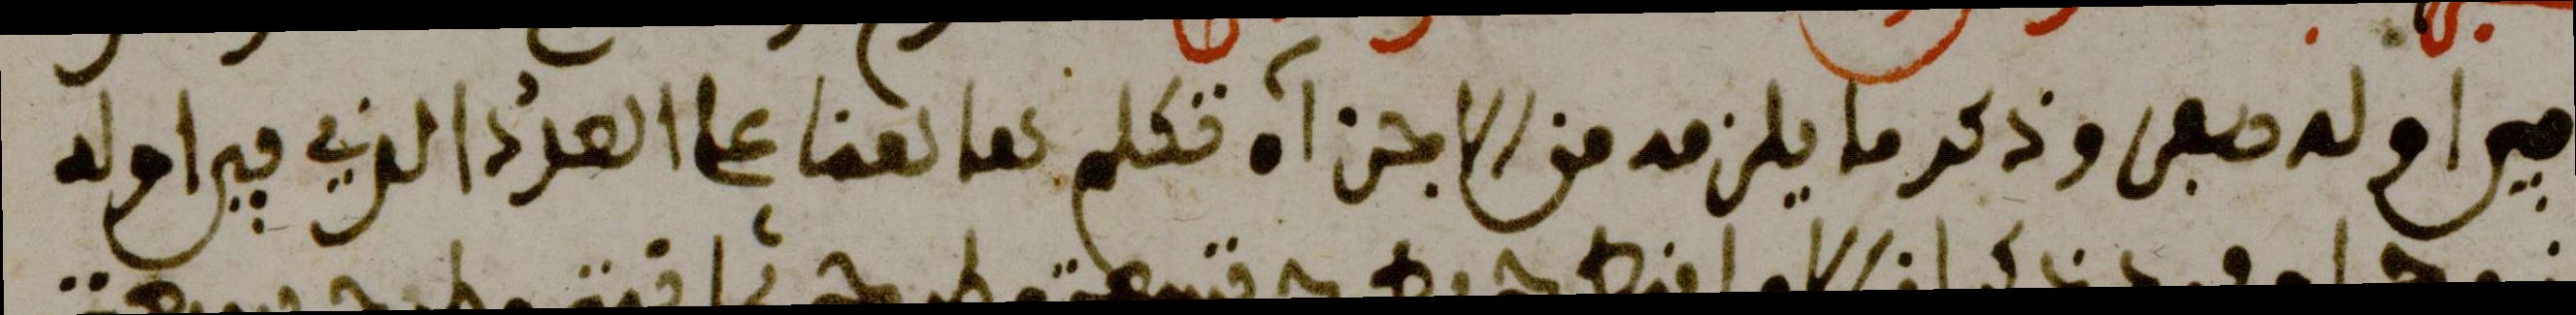في او له صفر وذكر ما يلزمه من الاجزاء تكلم ها هنا على العدد الذي في اوله
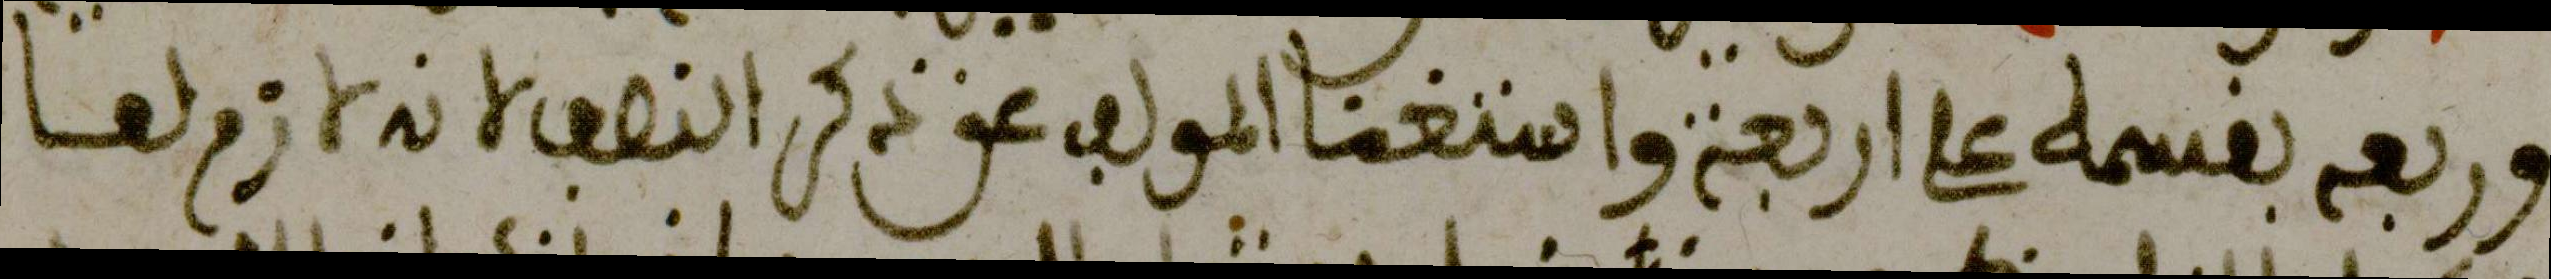وربعه بقسمه على اربعة واستغنا المولف عن ذكر النصف لانه لازم لما
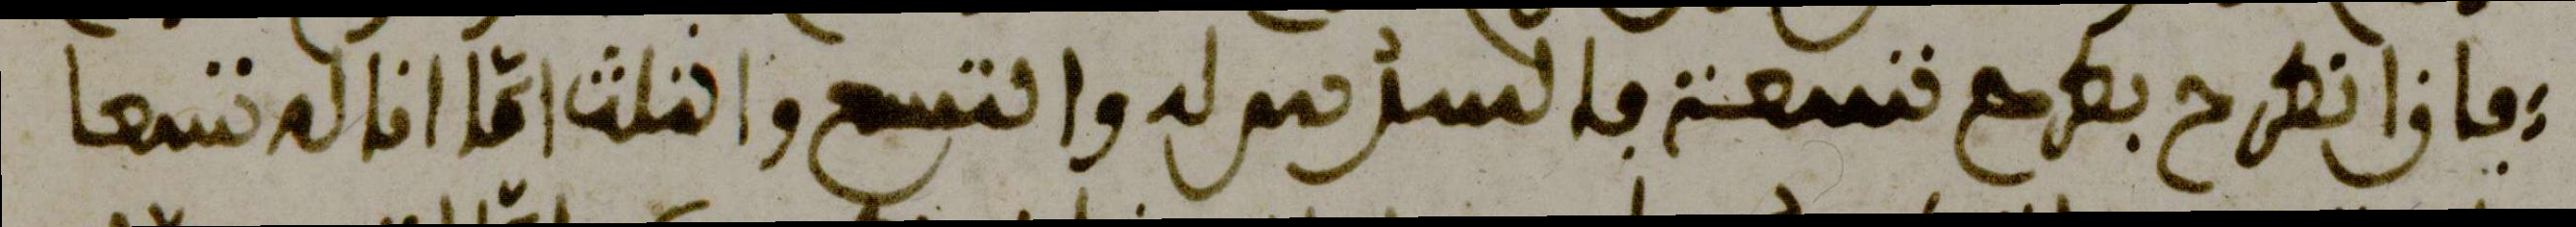فان نطرح بطرح تسعة فالسدس له والتسع والثلث امّا انا له تسعا
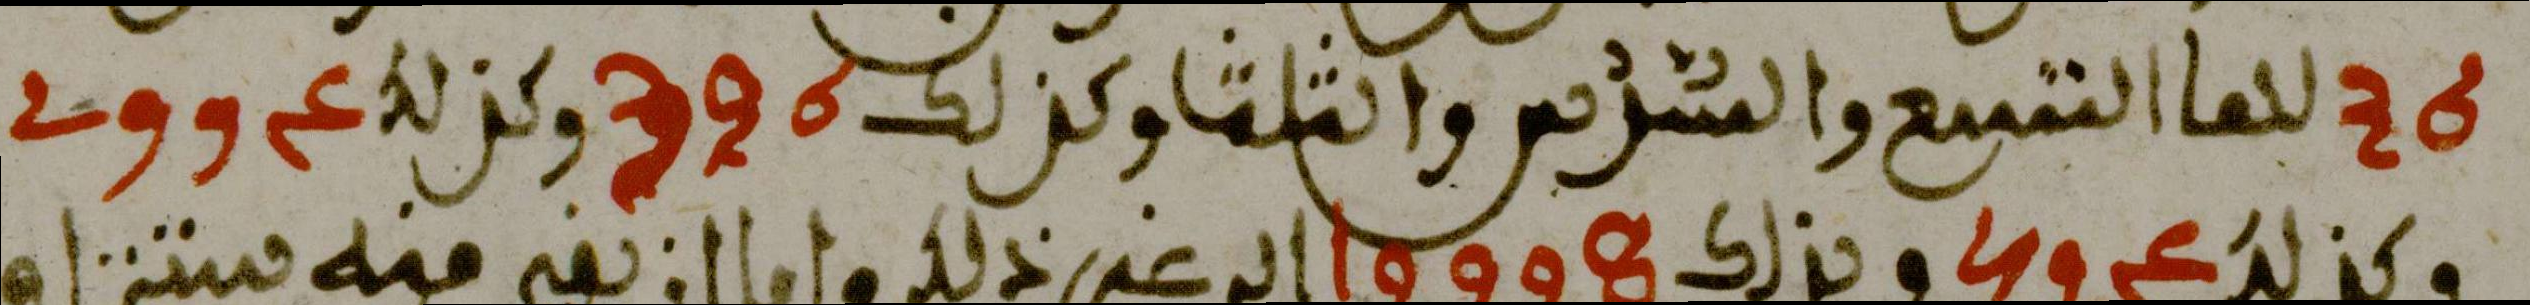لها التسع والسدس والثلث وكذلك 396 وكذلك 296 36
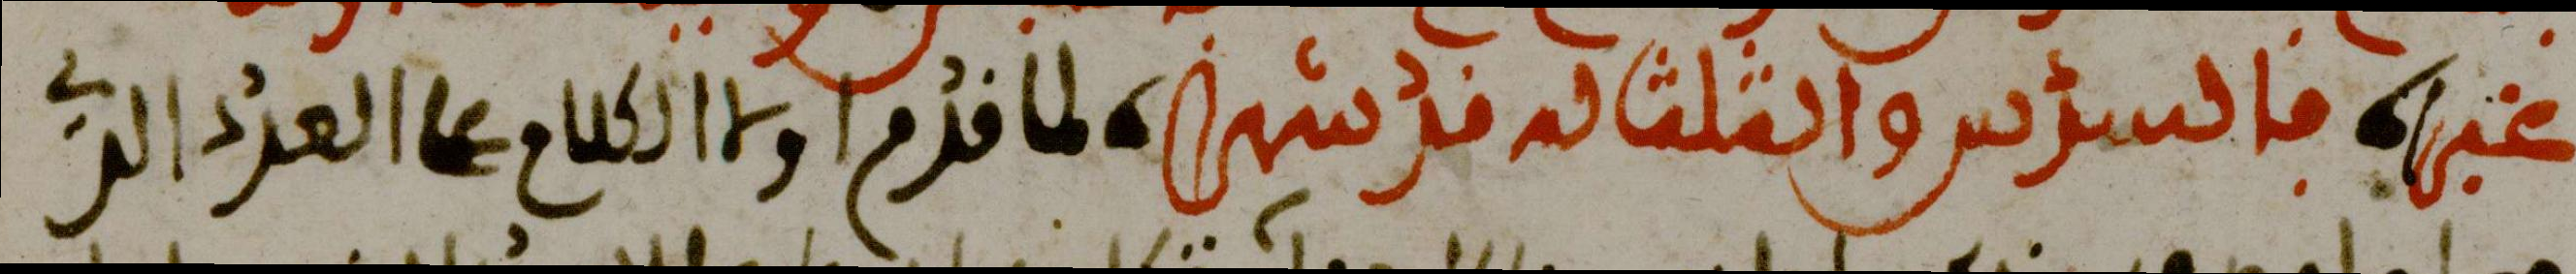غبرا فالسدس والثلث له قد شهرا لما قدم او ولا الكلام على العدد الذي
